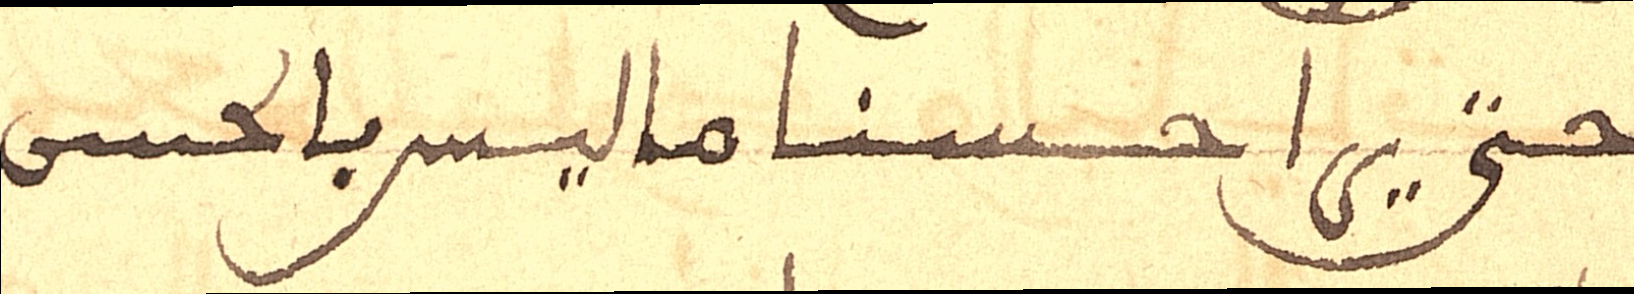حتى يرا حسنا ما ليسر بالحسن
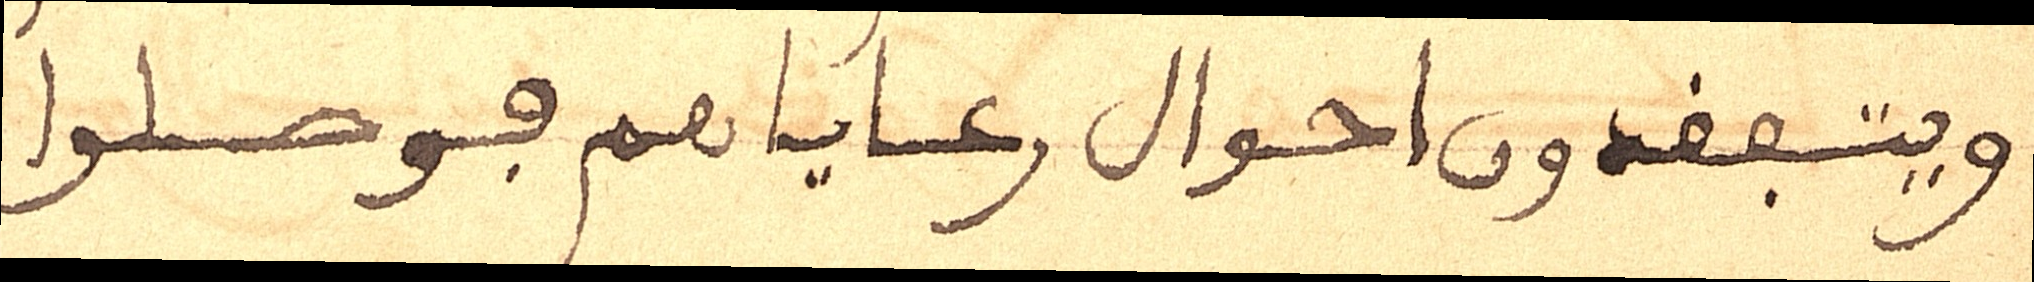ويتفقدون احوال رعاياهم فوصلوا
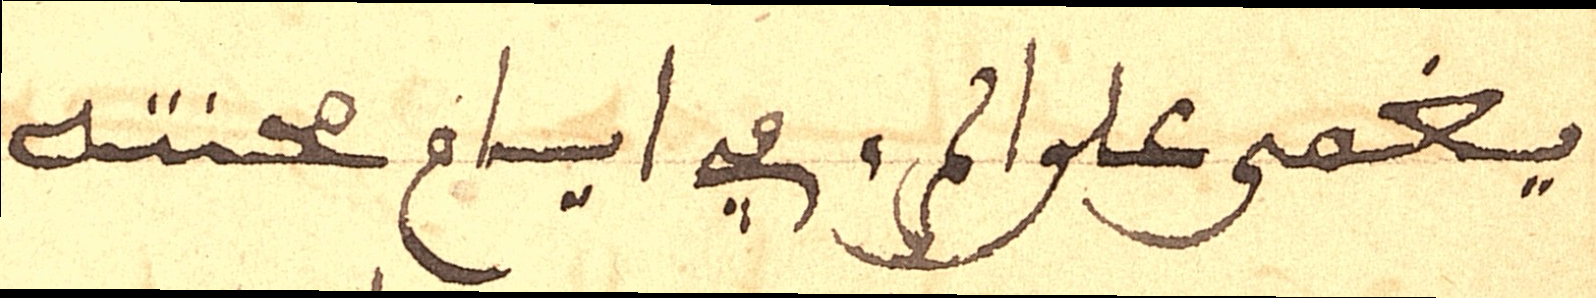يغمى على المرء في ايام محنته
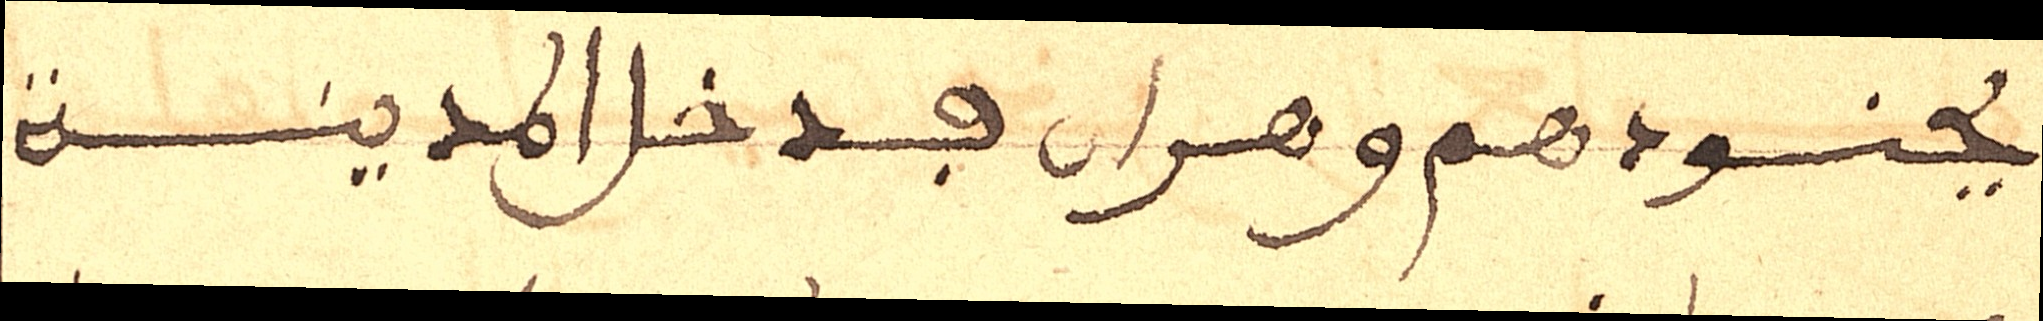بجنودهم وهران فدخل المدينة
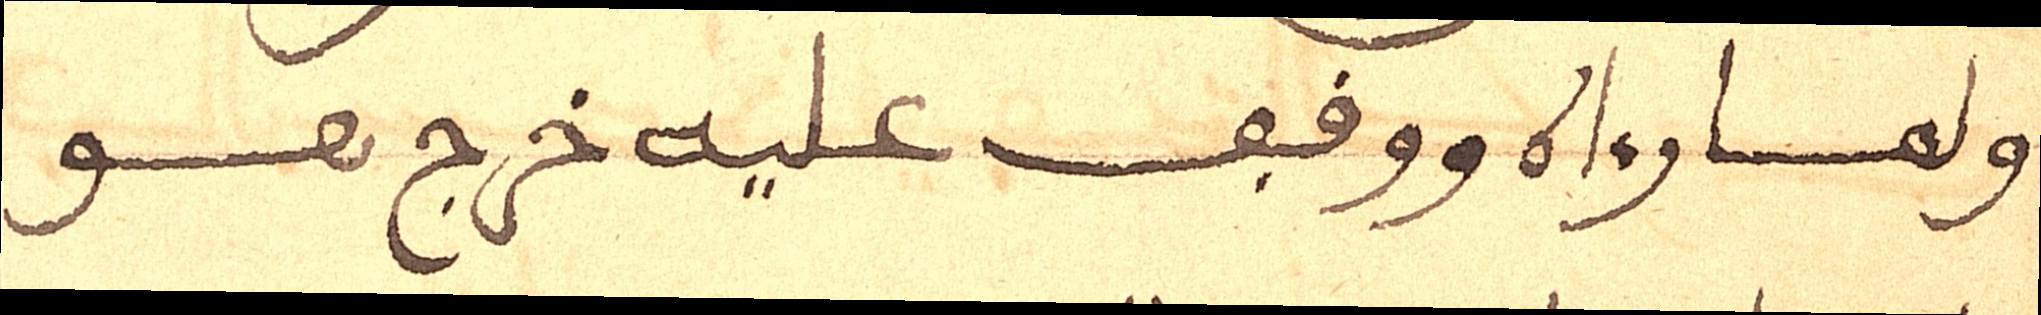ولما رءاه ووقف عليه خرج هو
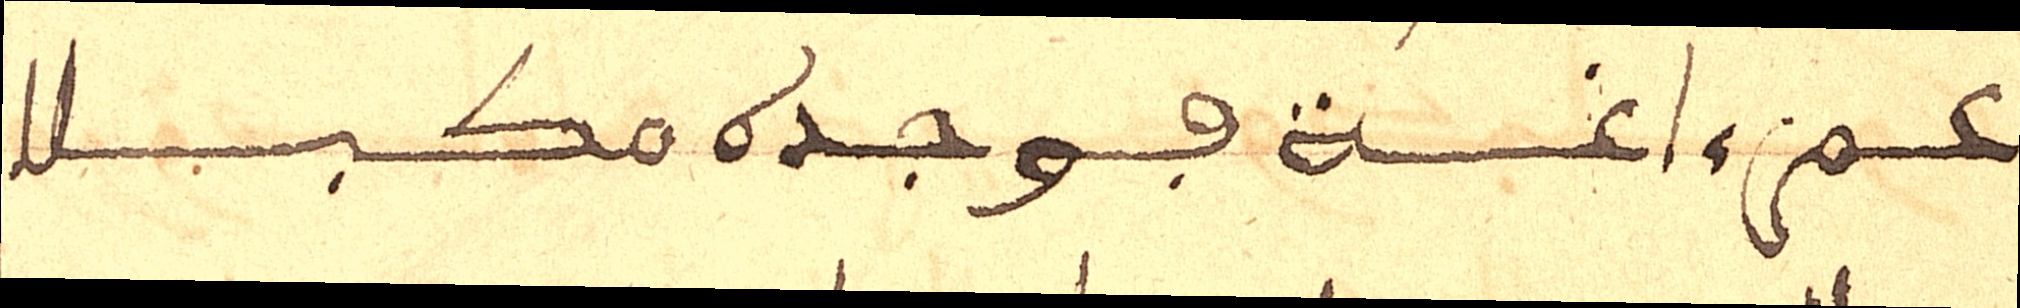عمر ءاغة فوجده مكبلا
